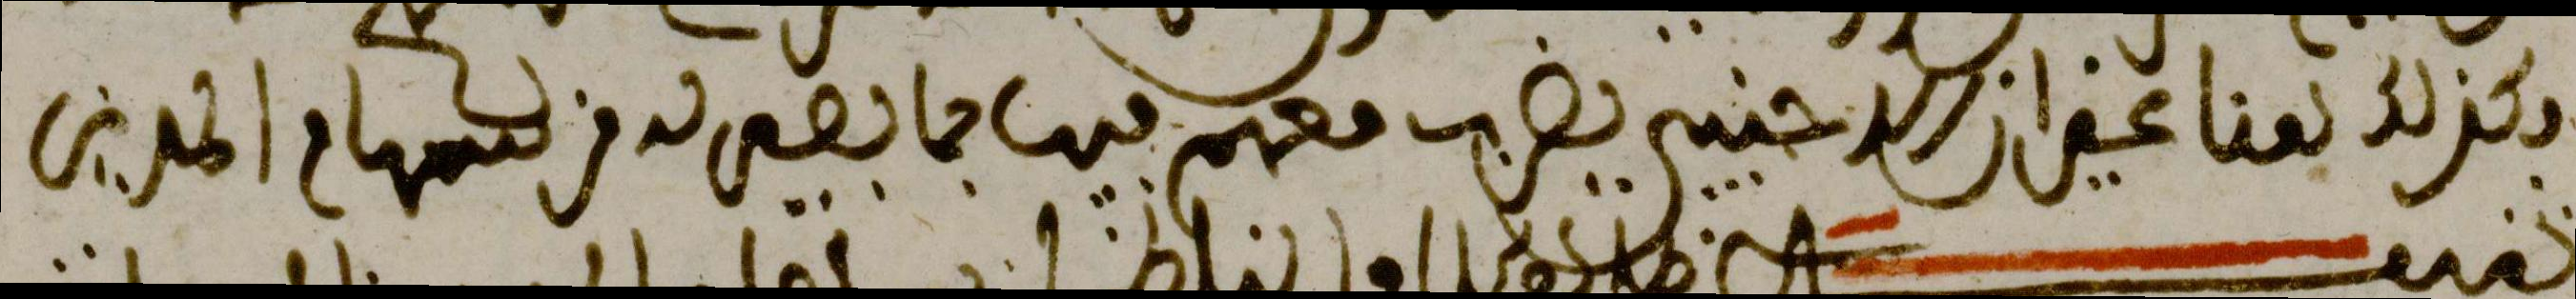فكذلك هنا غير ان الاجنبي يضرب معهم فيها بما يصير له من سهام المدين
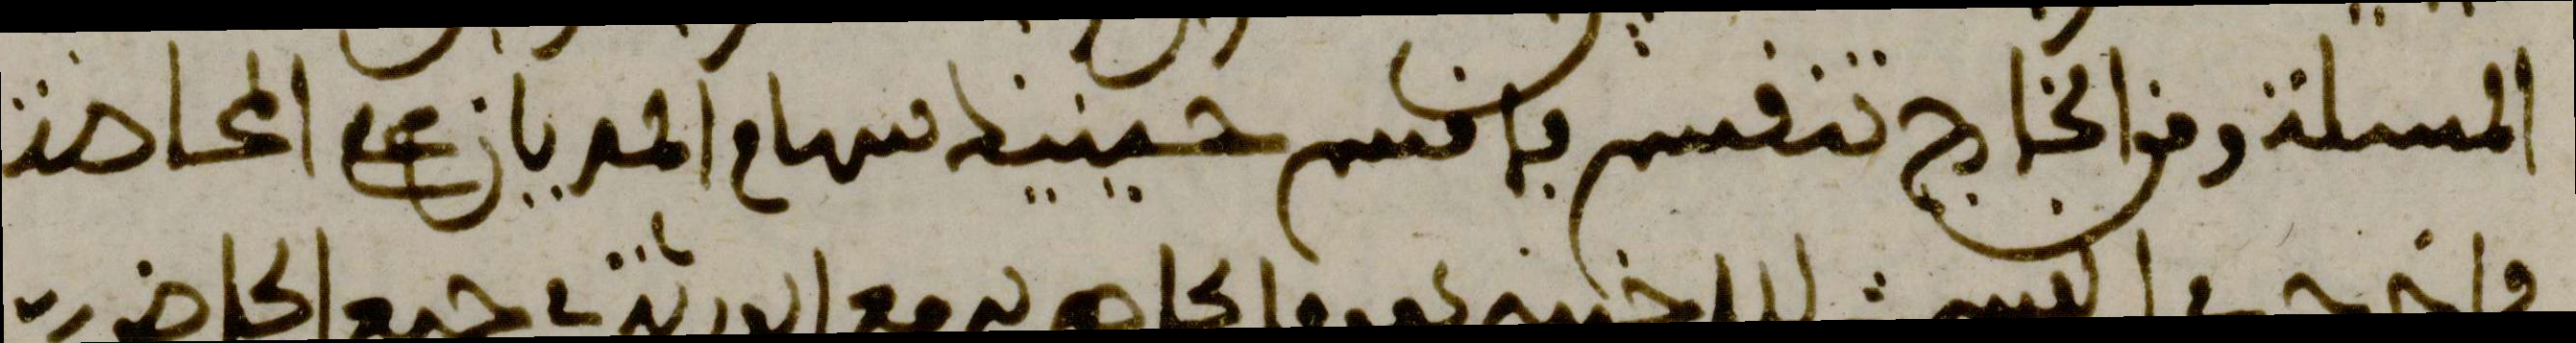المسلة ومن الخارج تنقسم فاقسم حينيذ سهام المديان على المحاصة
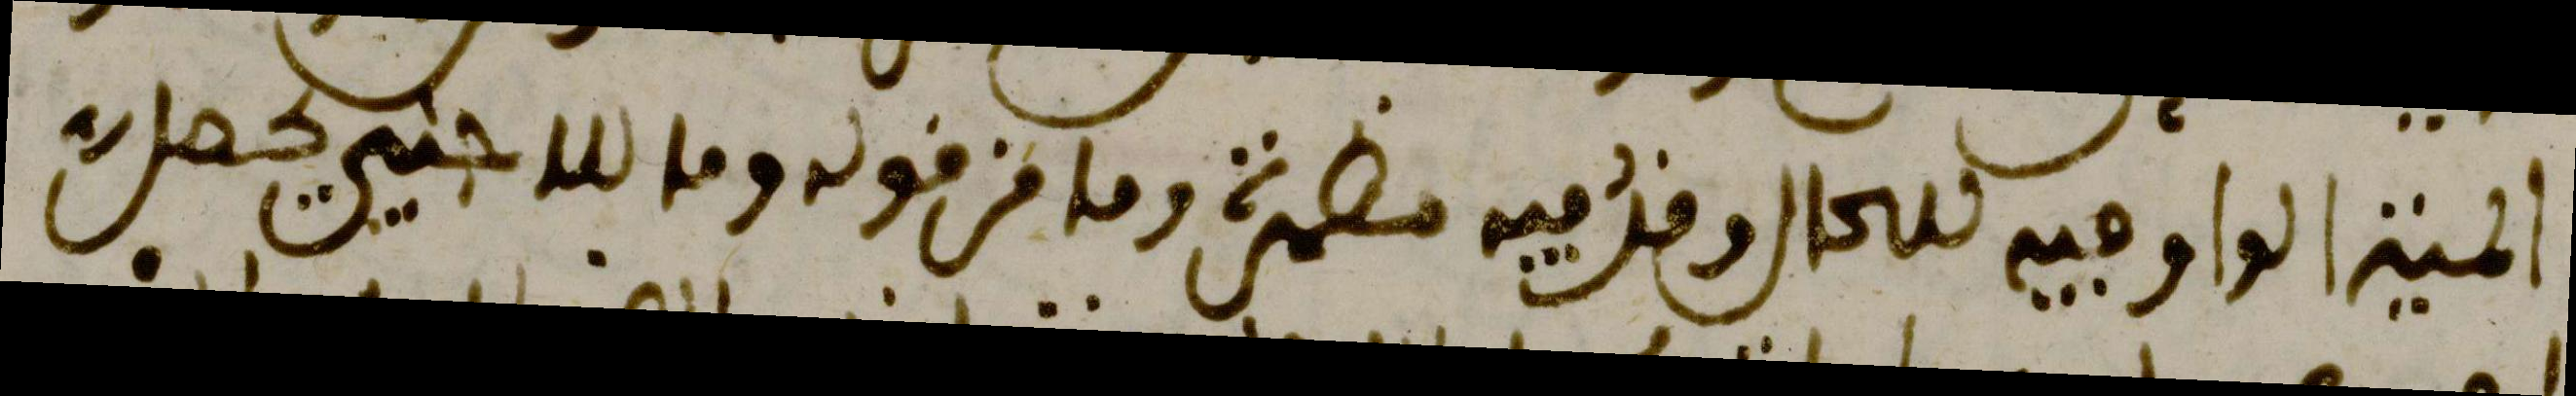المية الواو فيه للحال وقد فيه مضمرة وما من قوله وما للاجنبي يحصل
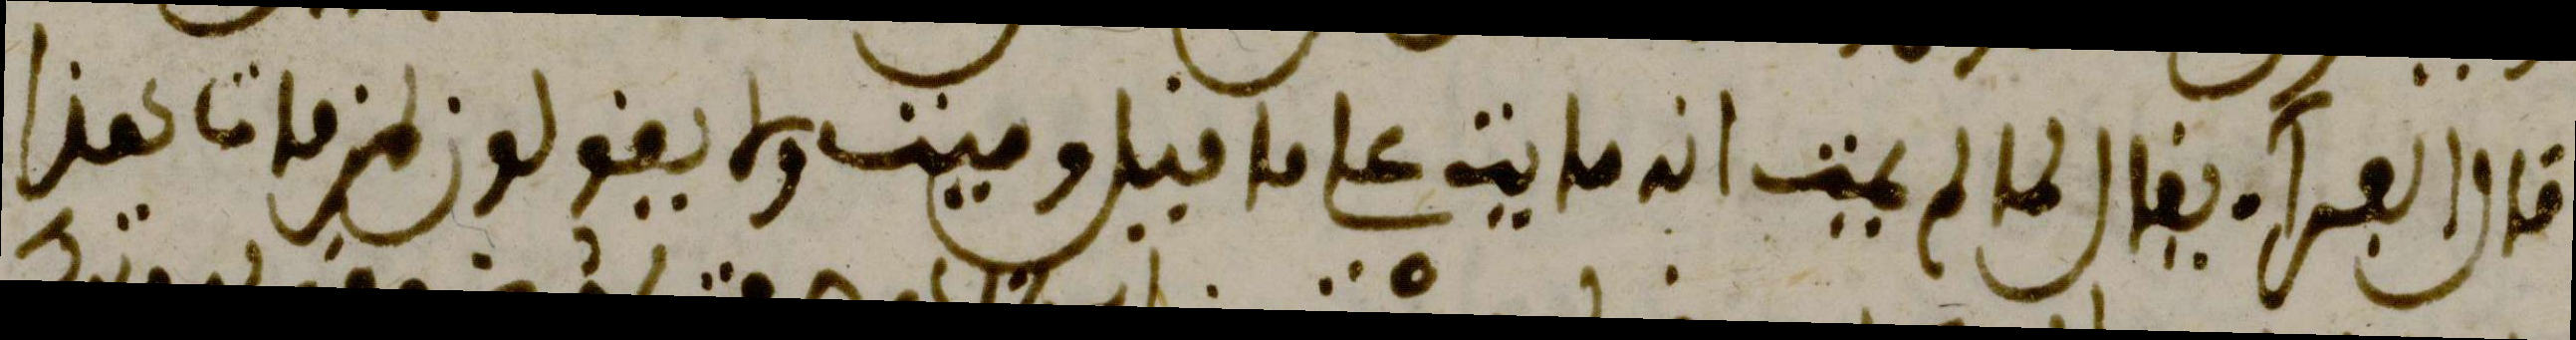قال القراء يقال لما لم يمت على ما قيل وميت ولا يقولون لمن مات هذا
